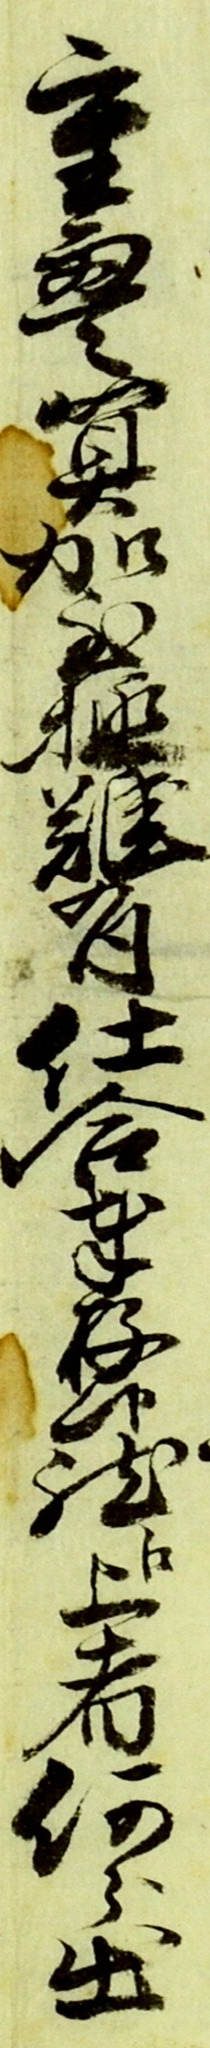重量冥加至極難有仕合奉存候然ル上者何分出
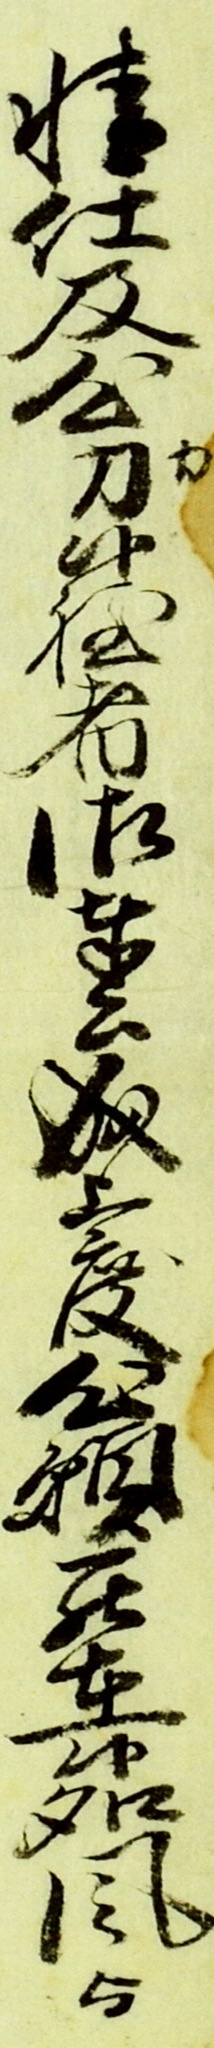情仕及公力候然者御奉公成上度公願罷在候処風与
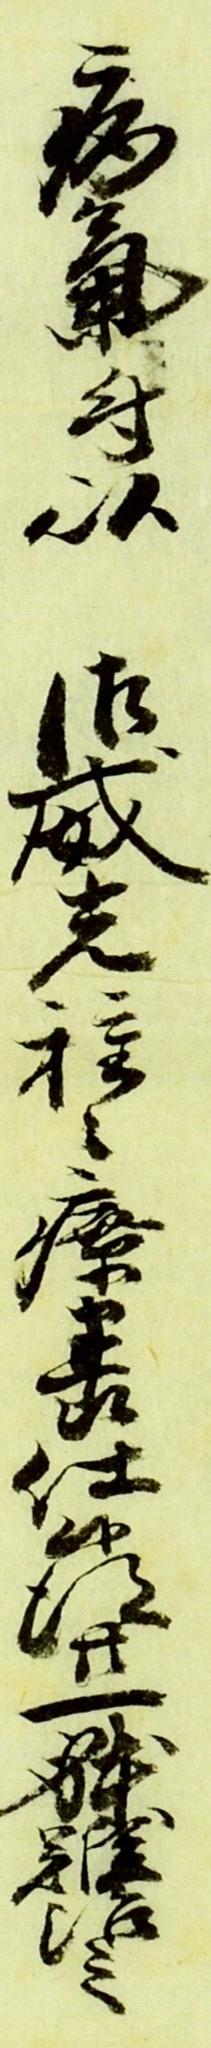病気ニ付以御威光種々療養仕候得共一躰難渋之
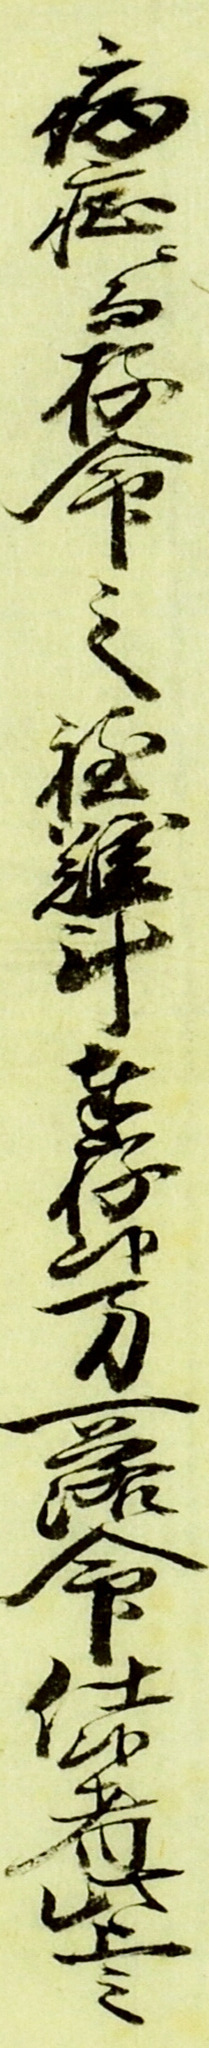病症ニ而存命之程難斗奉存候万一落命仕候者此上之
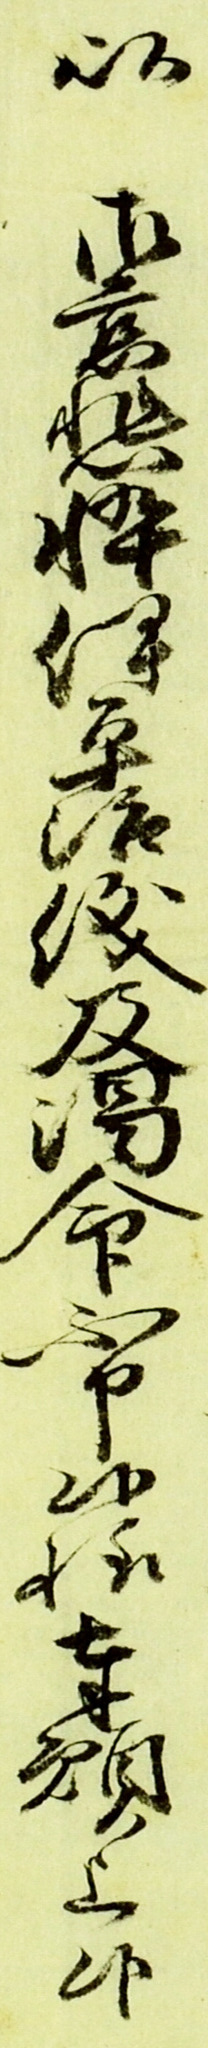以御慈悲倅伊平治儀及渇命不申候様奉願上候
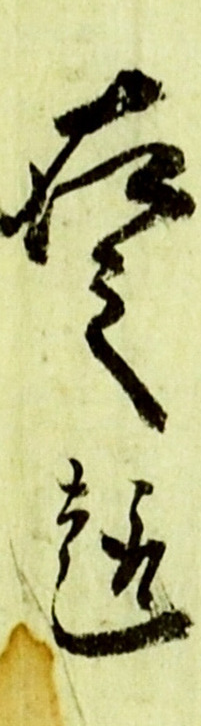右之趣
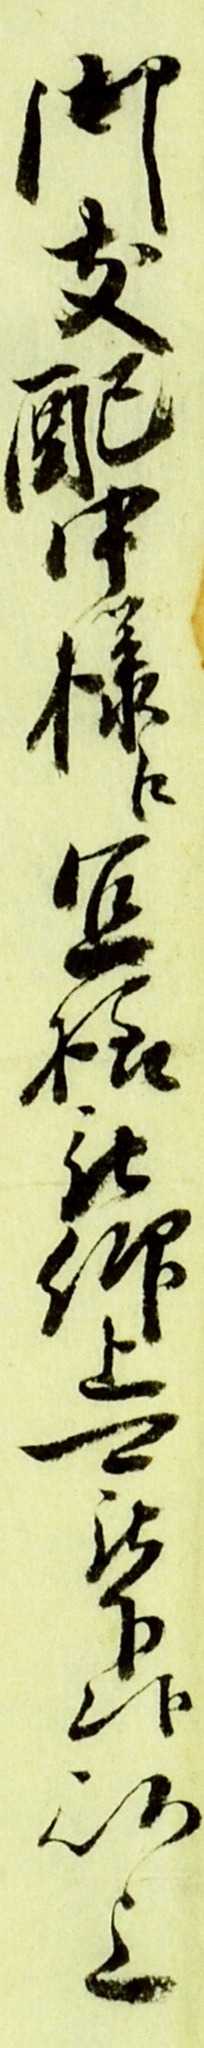御支配中様江宜様被仰上可被下候以上
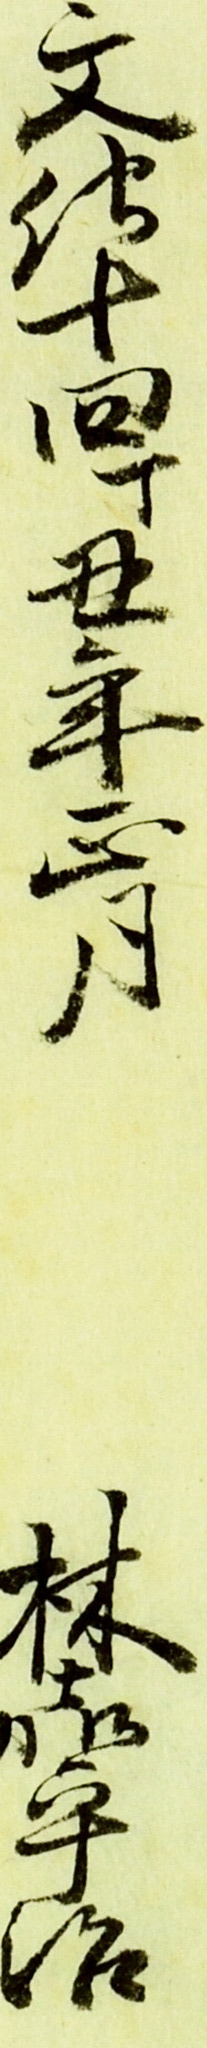文化十四丁丑年正月林嘉平治
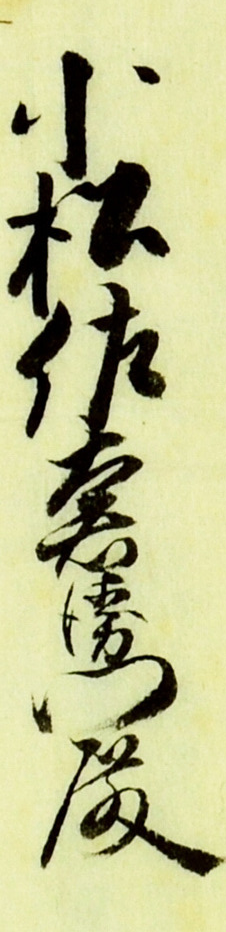小松佐太右衛門殿
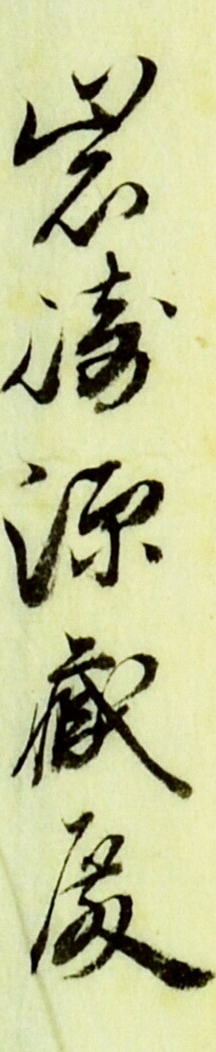岩崎源蔵殿

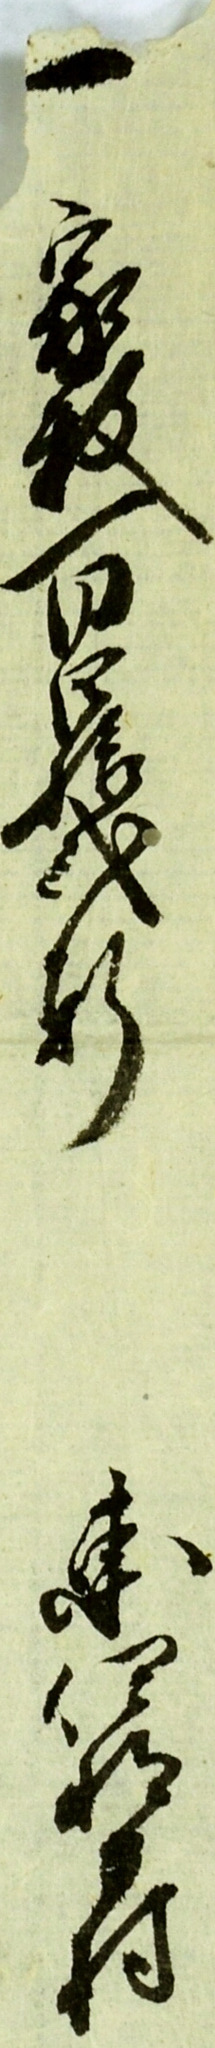一家数百四拾弐軒東伊那村
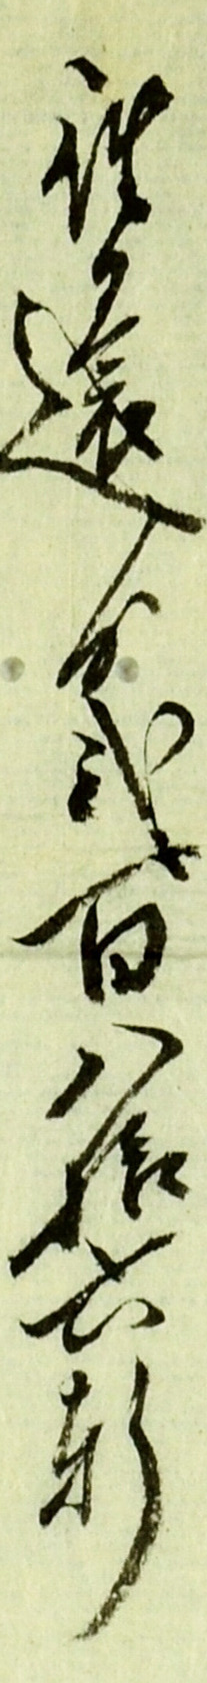往還ゟ弐百八拾六軒
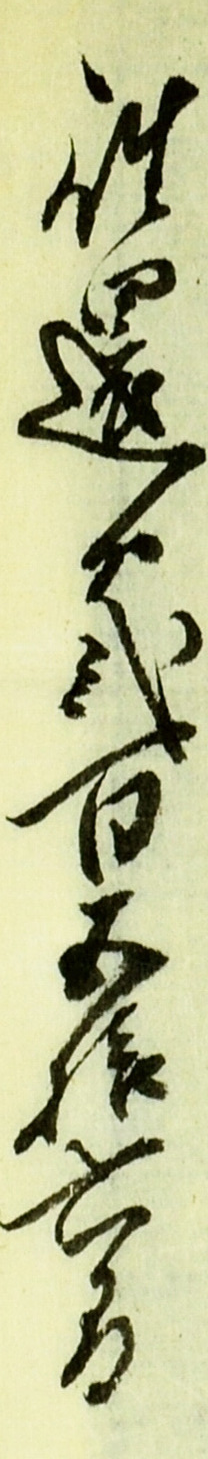往還ゟ弐百五拾六間
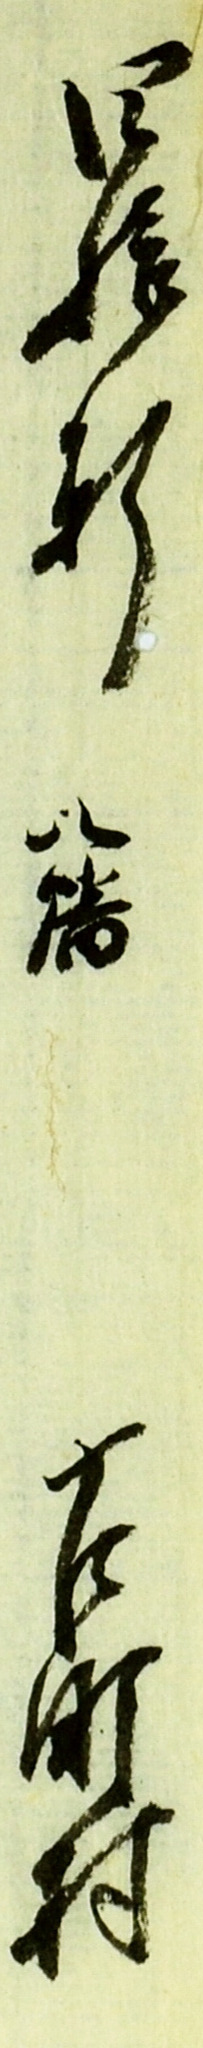四拾軒八幡古町村
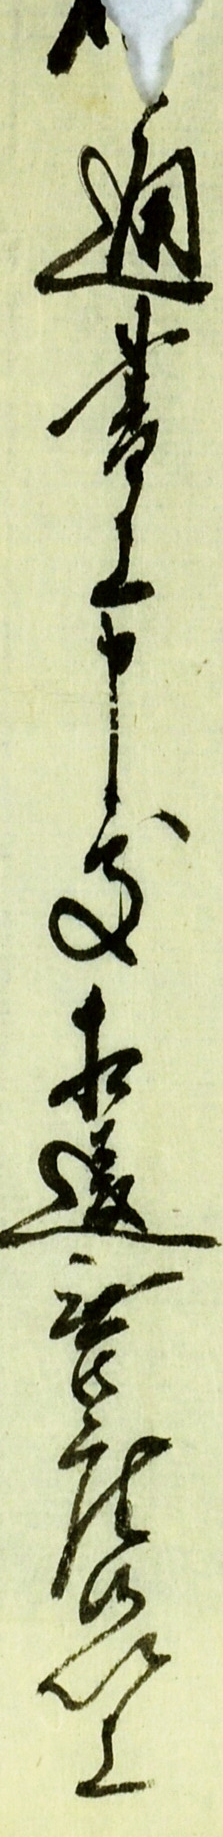右之通書上申処相違無御座候以上
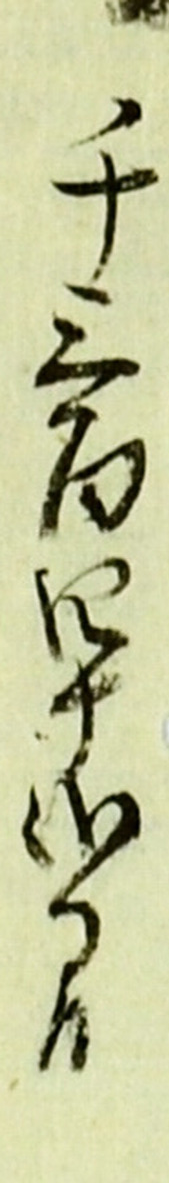千三百四十弐間
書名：覚
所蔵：伊那市立高遠町図書館・合同会社AMANE
